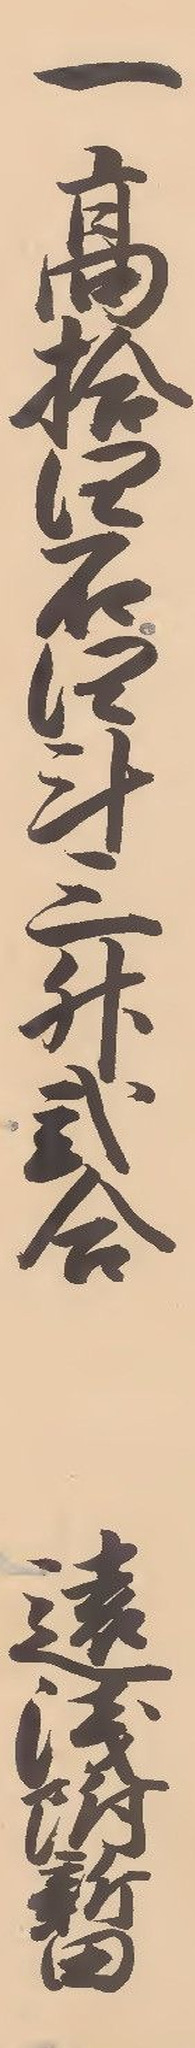一高拾四石四斗三升弐合遠浅附新田

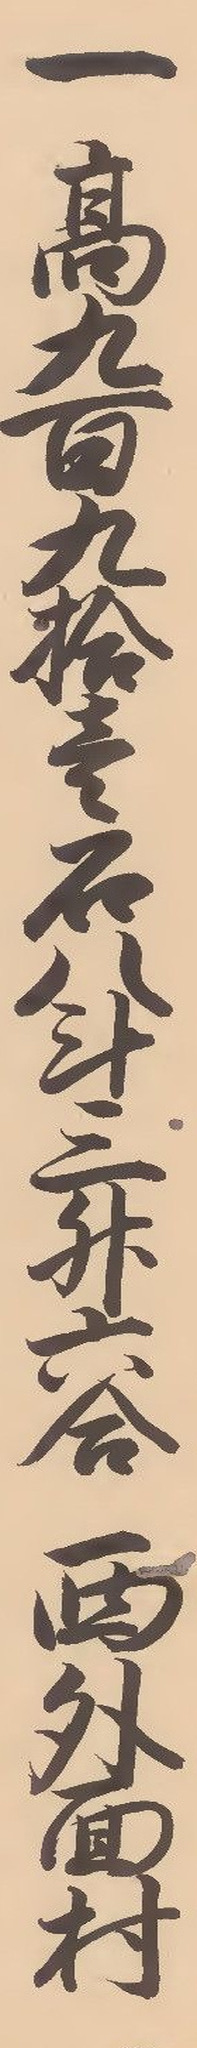一高九百九拾壱石八斗三升六合西外面村
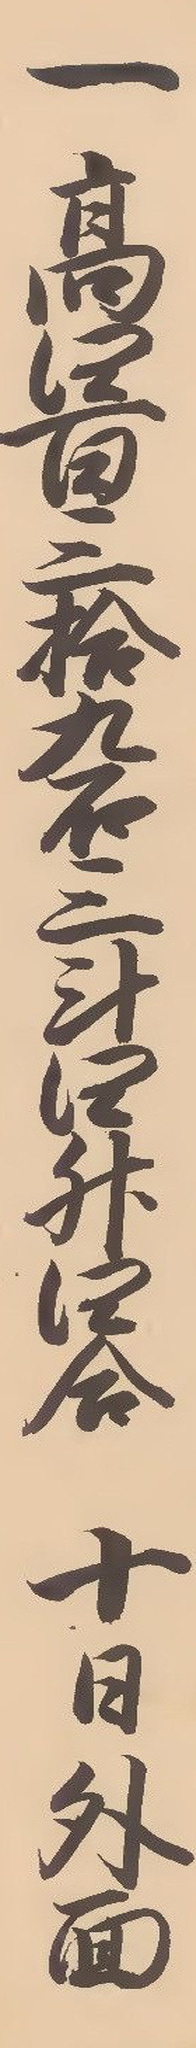一高四百三拾九石三斗四升四合十日外面
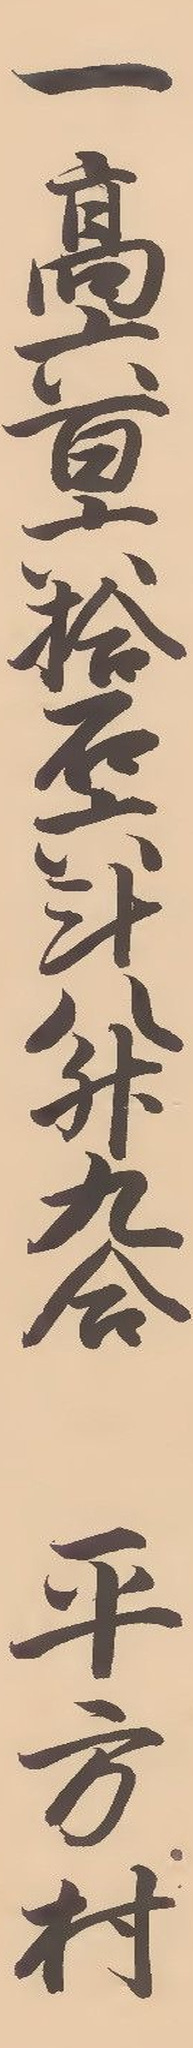一高六百六拾石六斗八升九合平方村
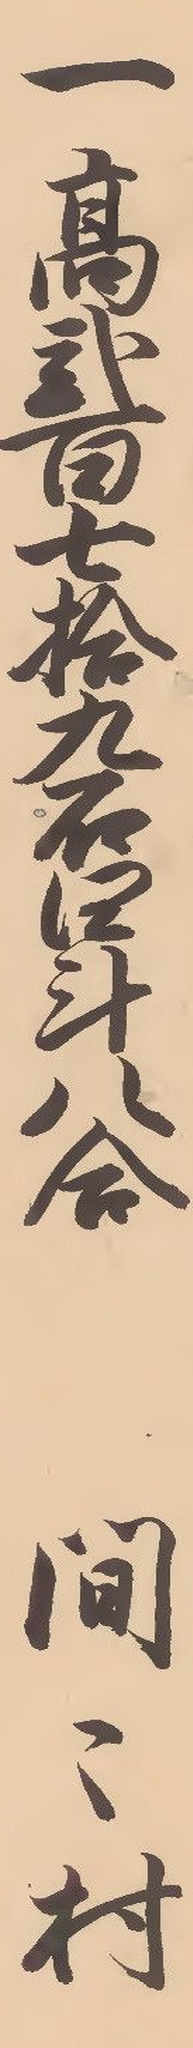一高弐百七拾九石四斗八合間々村
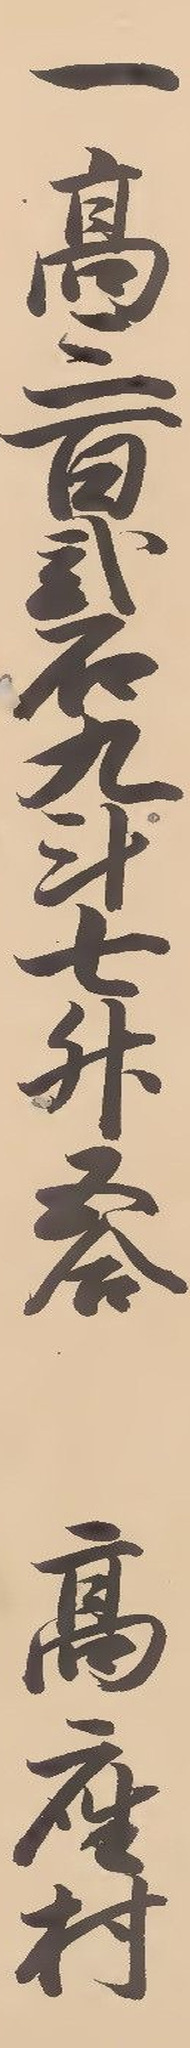一高三百弐石九斗七升五合高座村
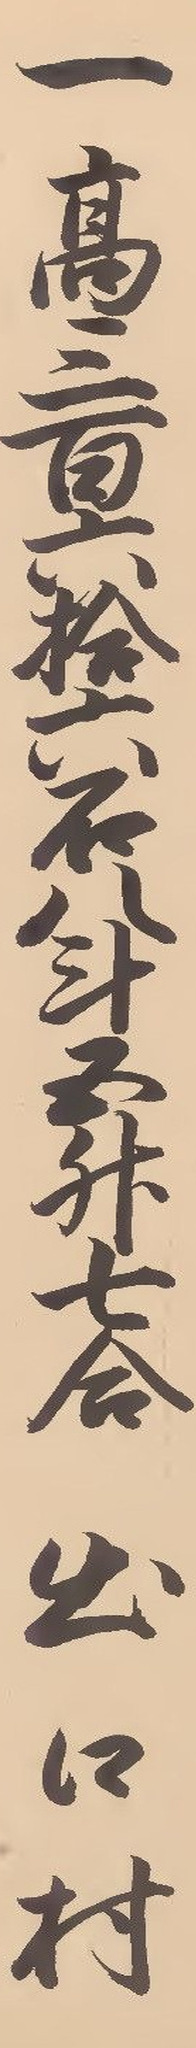一高三百六拾六石八斗五升七合出口村
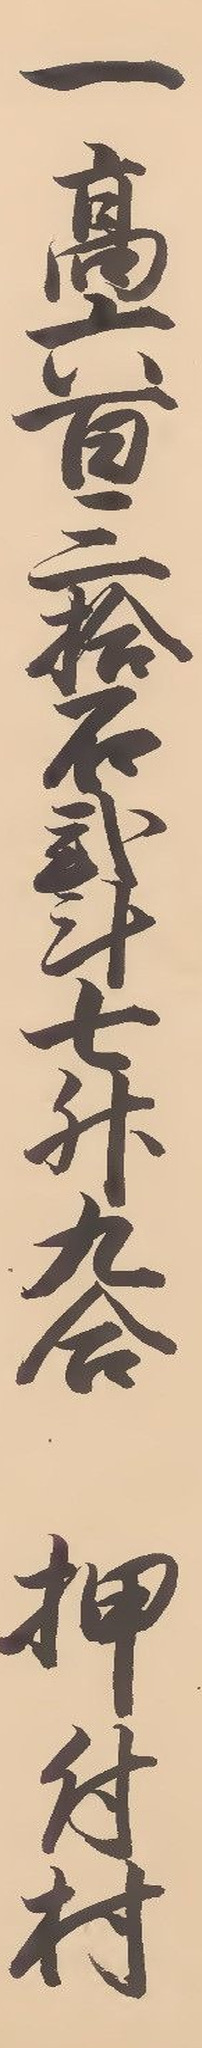一高六百三拾石弐斗七升九合押付村
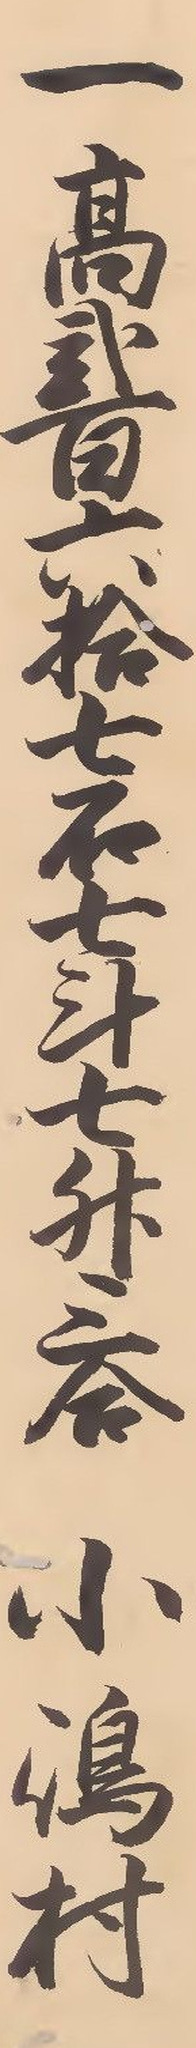一高弐百六拾七石七斗七升三合小嶋村

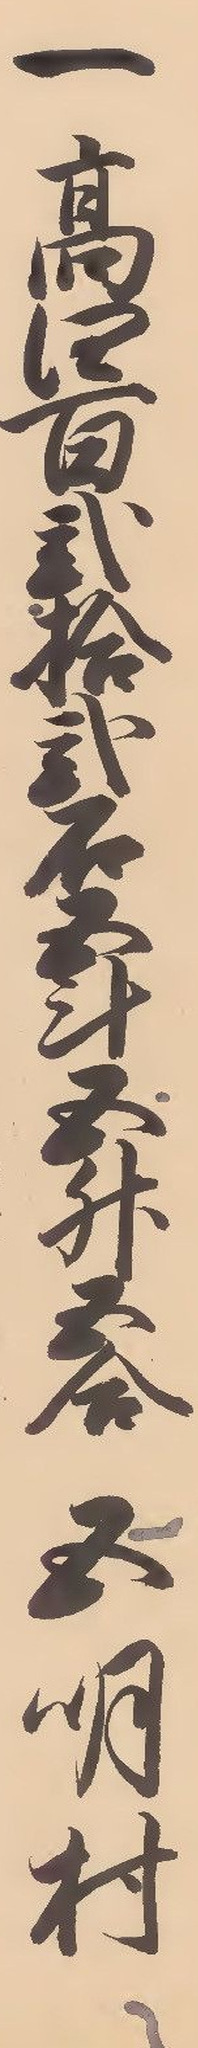一高四百弐拾弐石五斗五升五合五明村
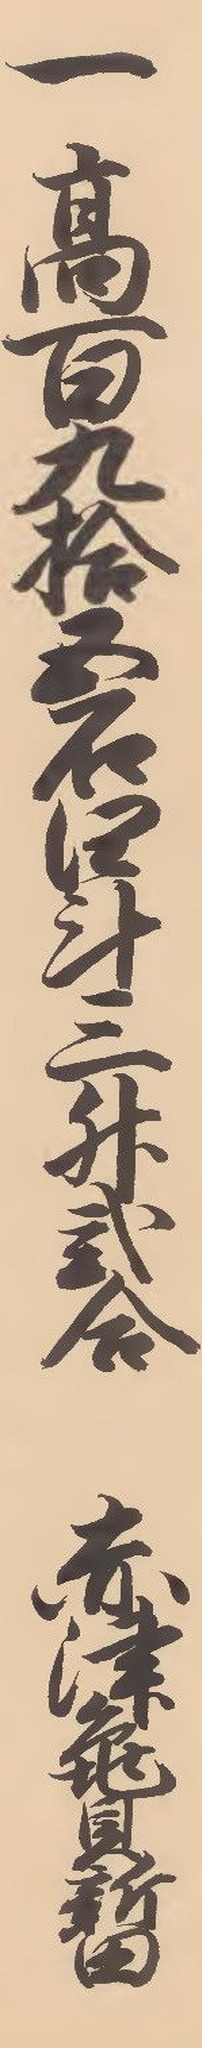一高百九拾五石四斗三升弐合赤津亀貝新田
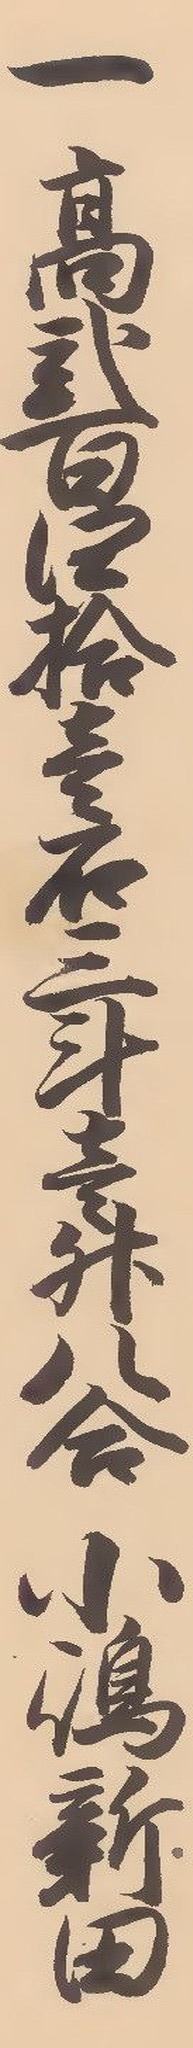一高弐百四拾壱石三斗壱升八合小嶋新田
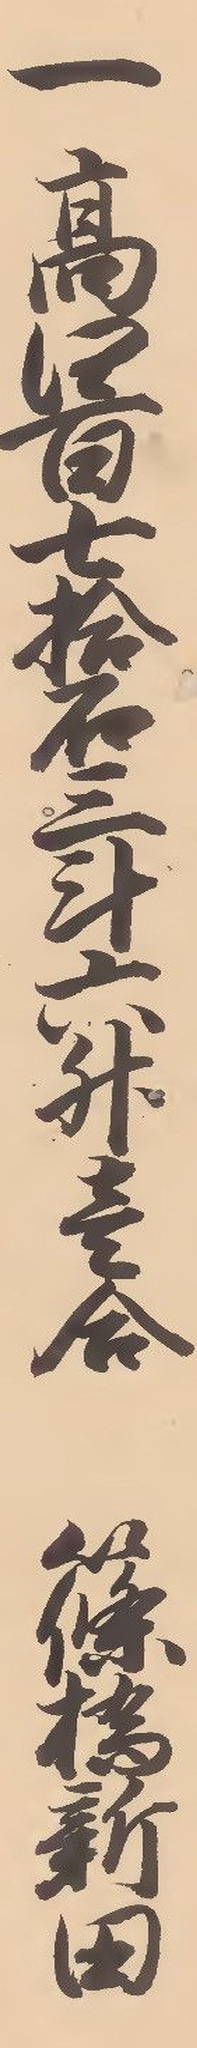一高四百七拾石三斗六升壱合篠橋新田
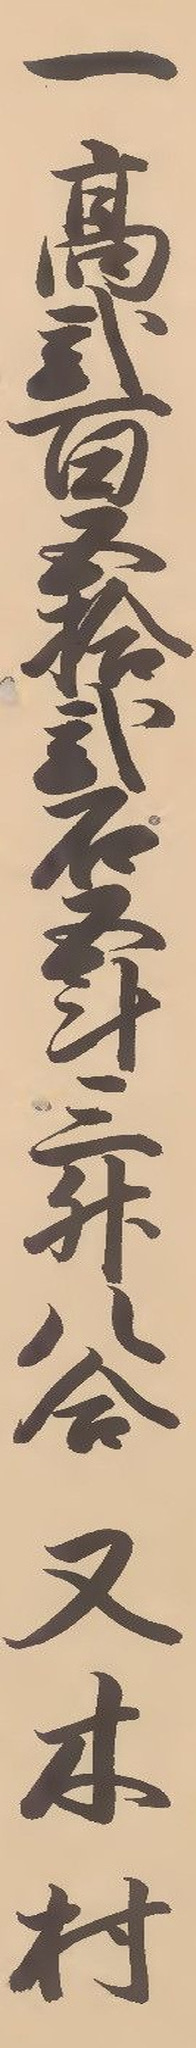一高弐百五拾弐石五斗三升八合又木村
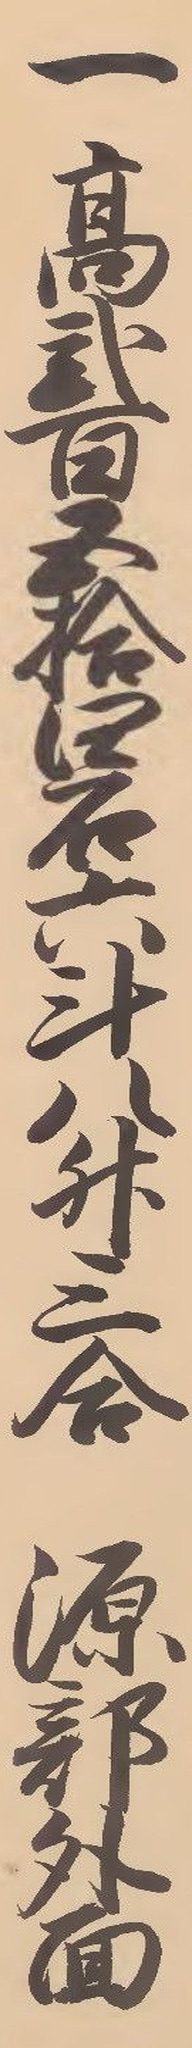一高弐百五拾四石六斗八升三合源部外面
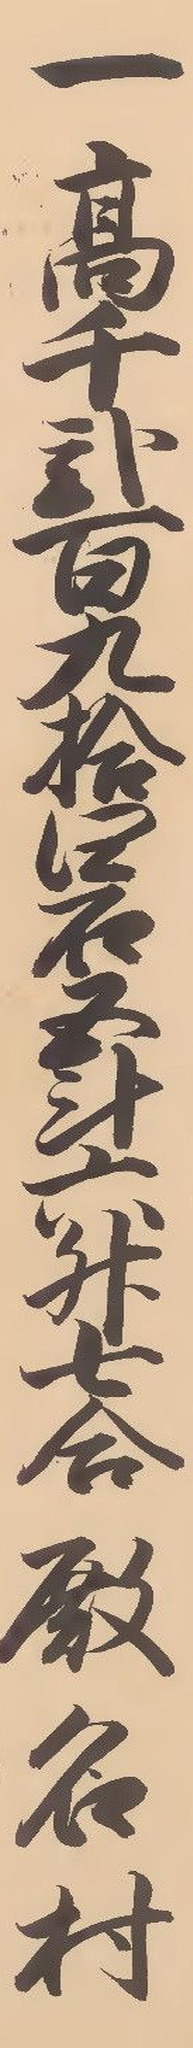一高千弐百九拾四石五斗六升七合殿名村
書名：伊勢国郷帳
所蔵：国立公文書館 National Archives of Japan
